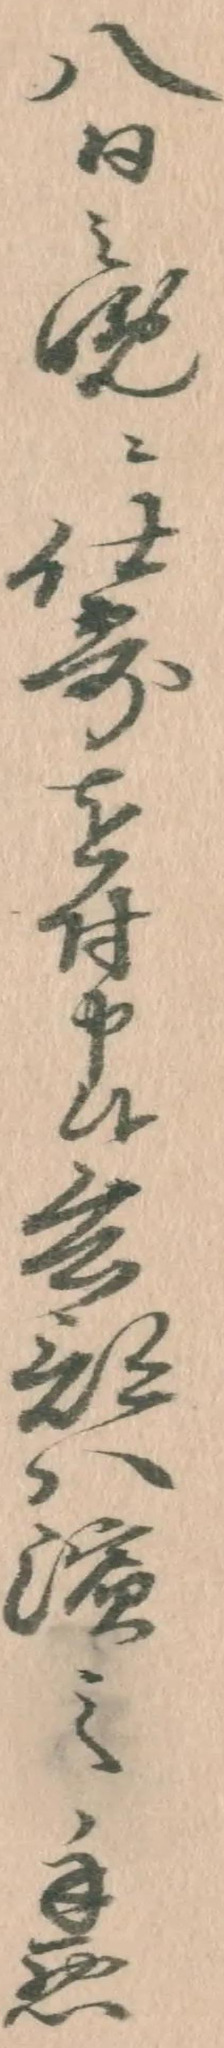八日之晩に仕寄を付申候兵部は浜之手悪
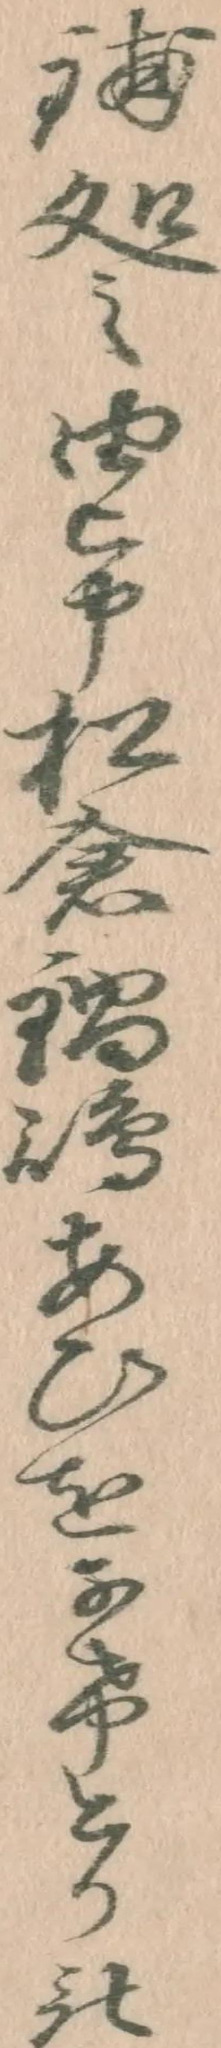鋪処之由被申松倉鍋島あひをか希とり被
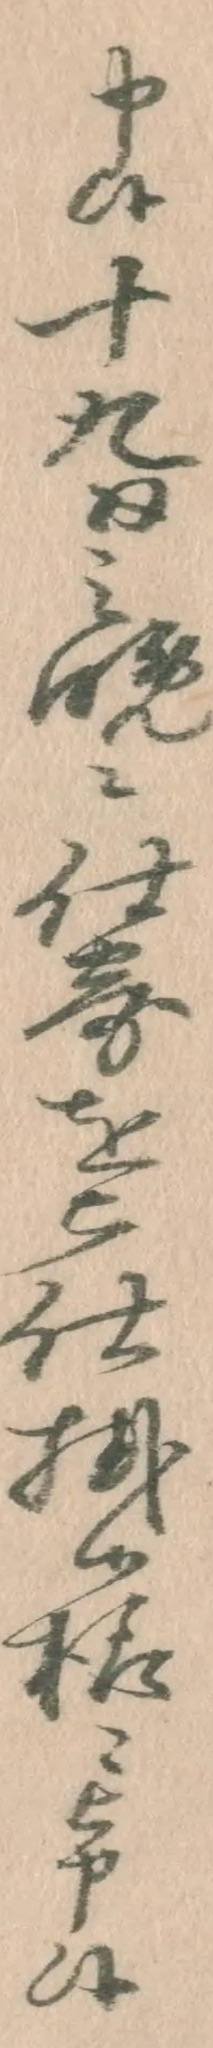申候十九日之晩に仕寄を被仕掛候様に被申候
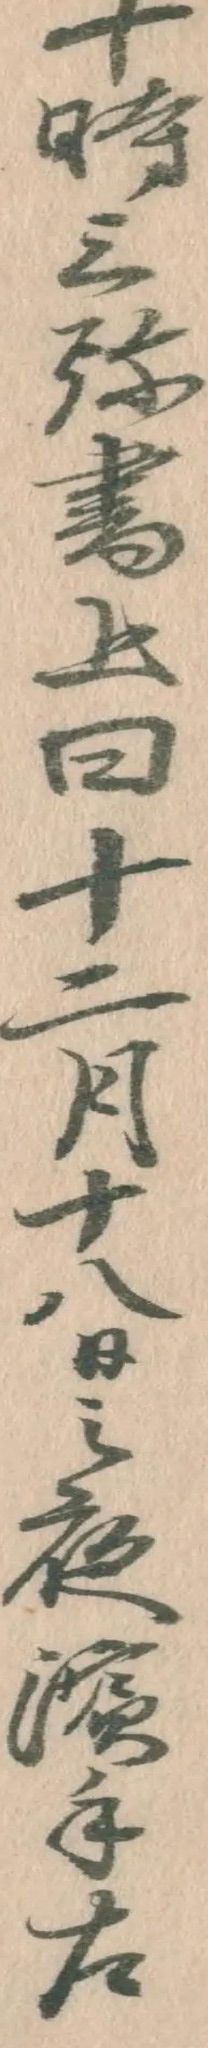十時三弥書上曰十二月十八日之夜浜手左
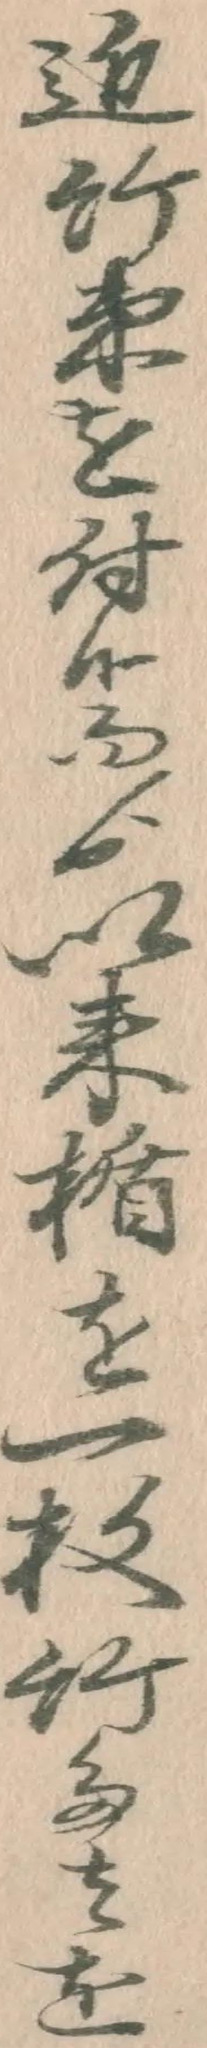近竹束を付候而ゟ以来楯を一枚竹多者を
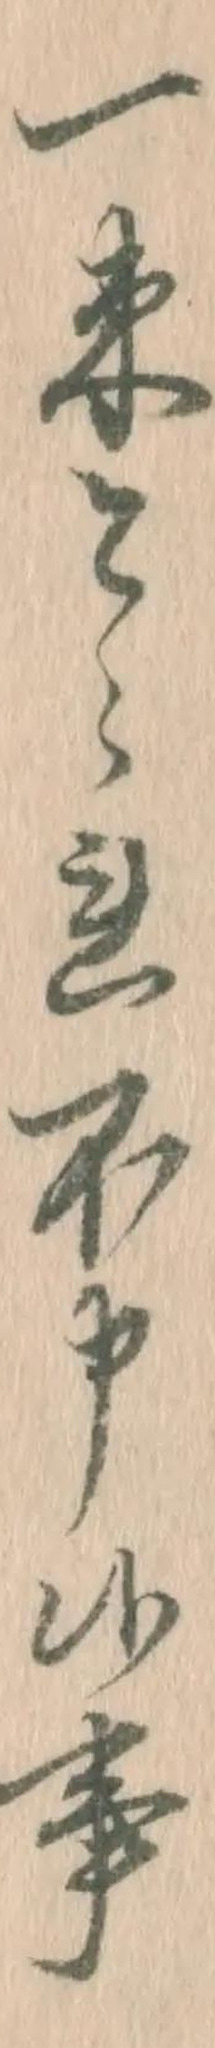一束とら連不申候事

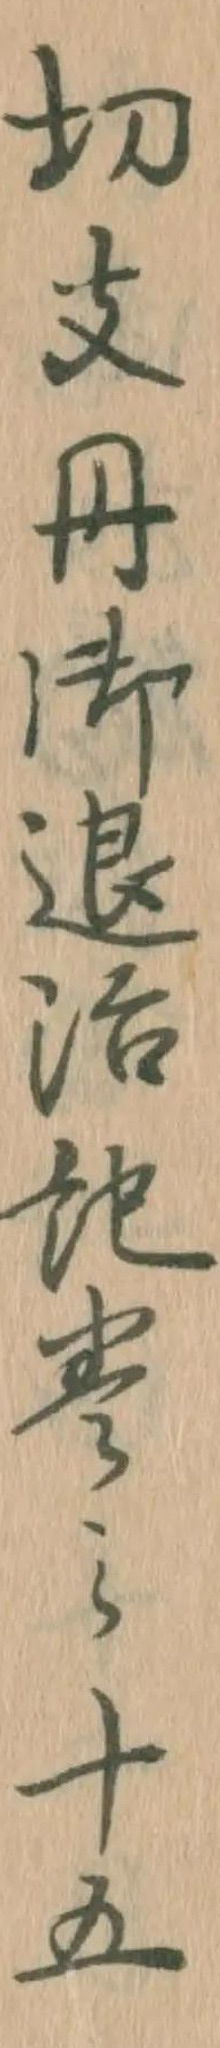切支丹御退治記巻之十五
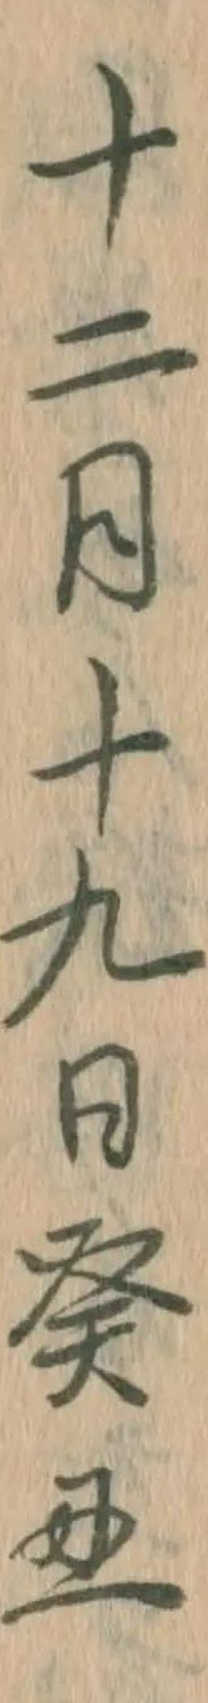十二月十九日癸丑
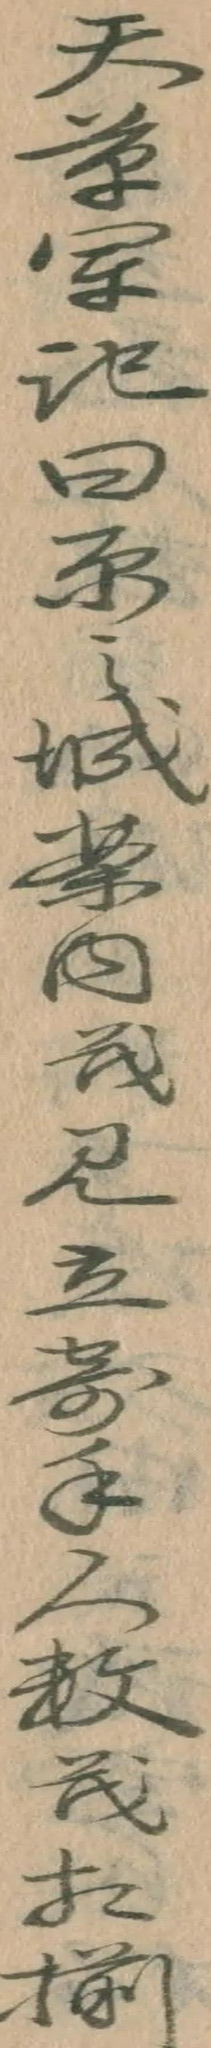天草軍記曰原之城案内茂見立寄手人数茂相揃
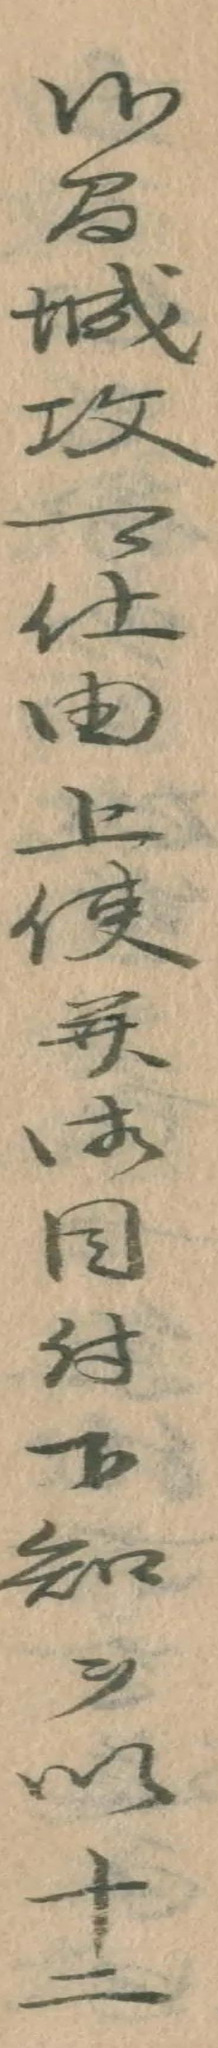候間城攻可仕由上使幷御目付下知を以十二
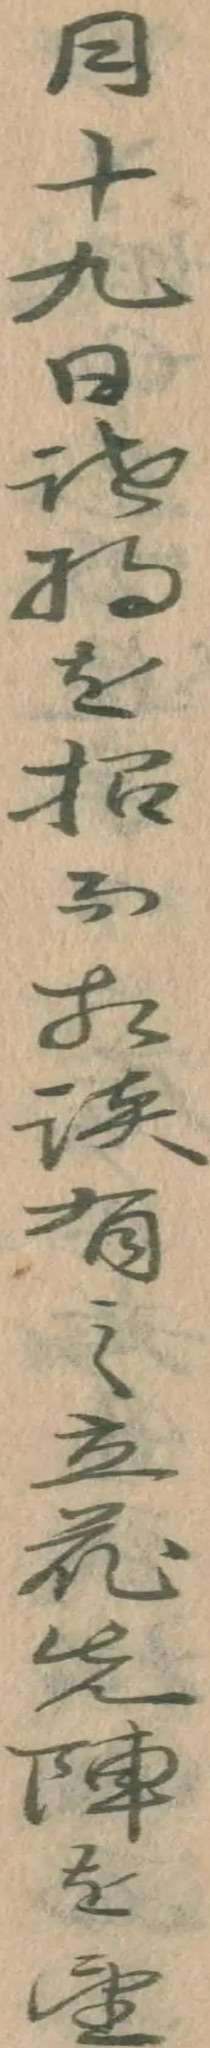月十九日諸将を招而相談有之立花先陣を望
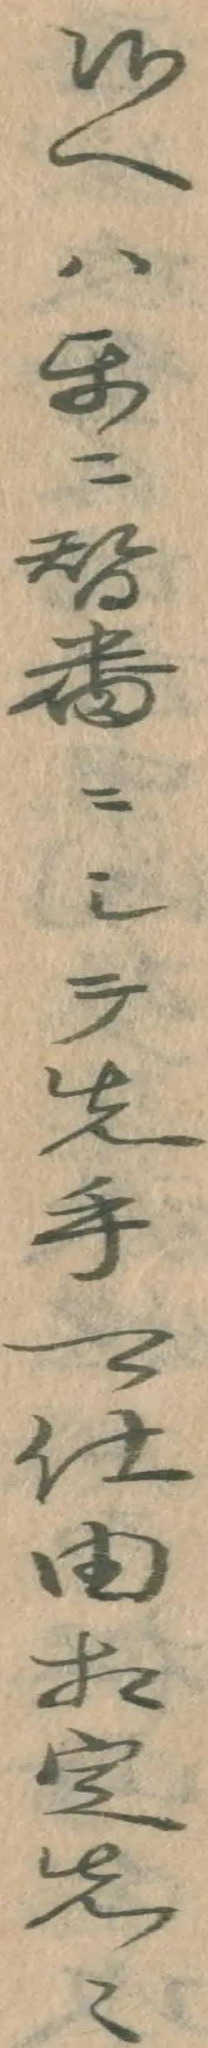候へは互に替番にして先手可仕由相定先々
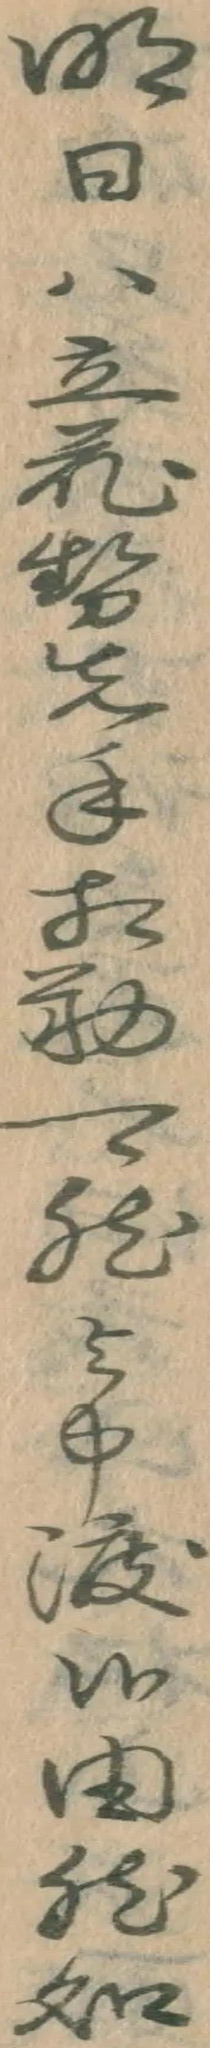明日は立花勢先手相勤可然与申渡候由然処
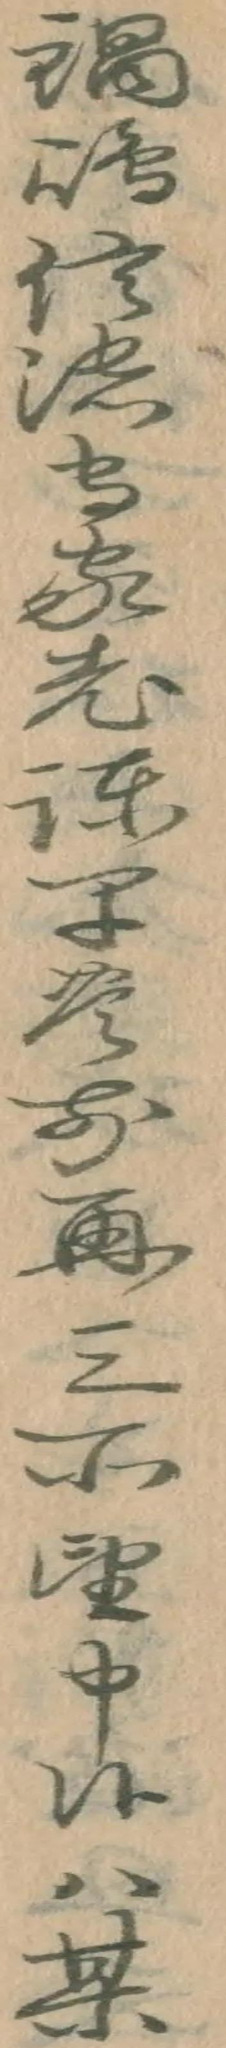鍋島信濃守家老諌早豊前再三所望申候は某
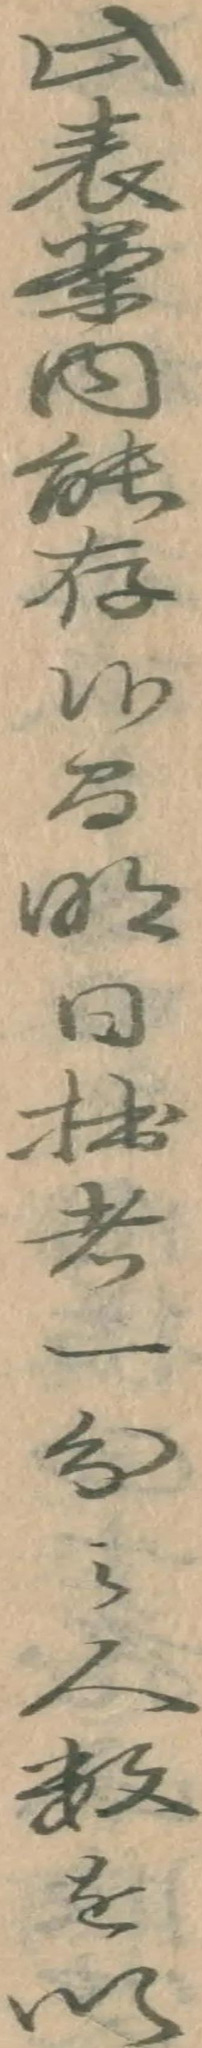此表案内能存候間明日拙者一分之人数を以

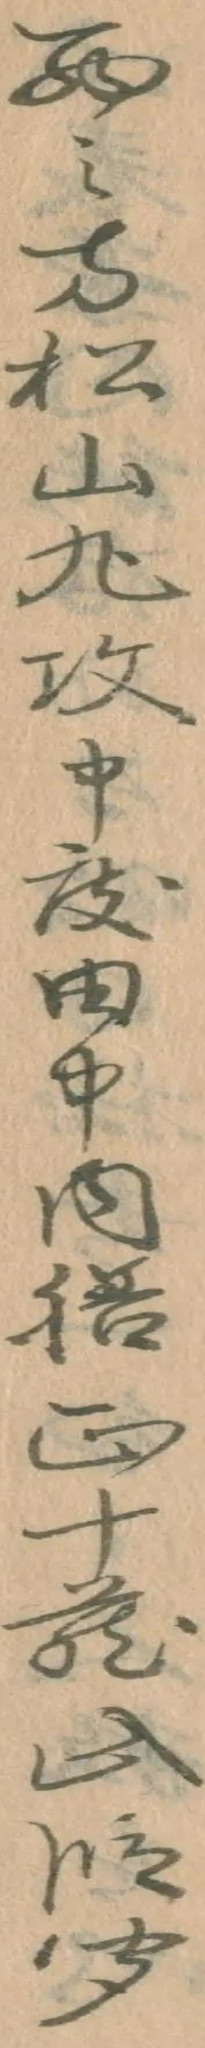西之方松山丸攻申度田中内膳正十蔵此段聞
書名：切支丹御退治記 49巻. [4]
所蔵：国立国会図書館 National Diet Library, JAPAN
